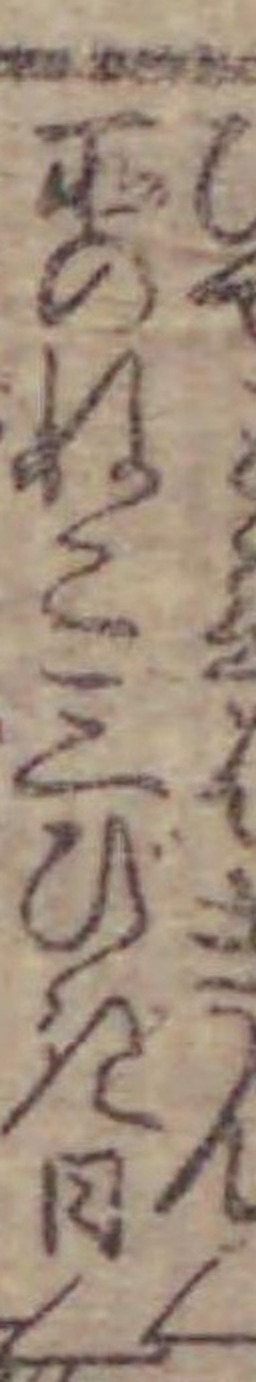所のねこ三びき日
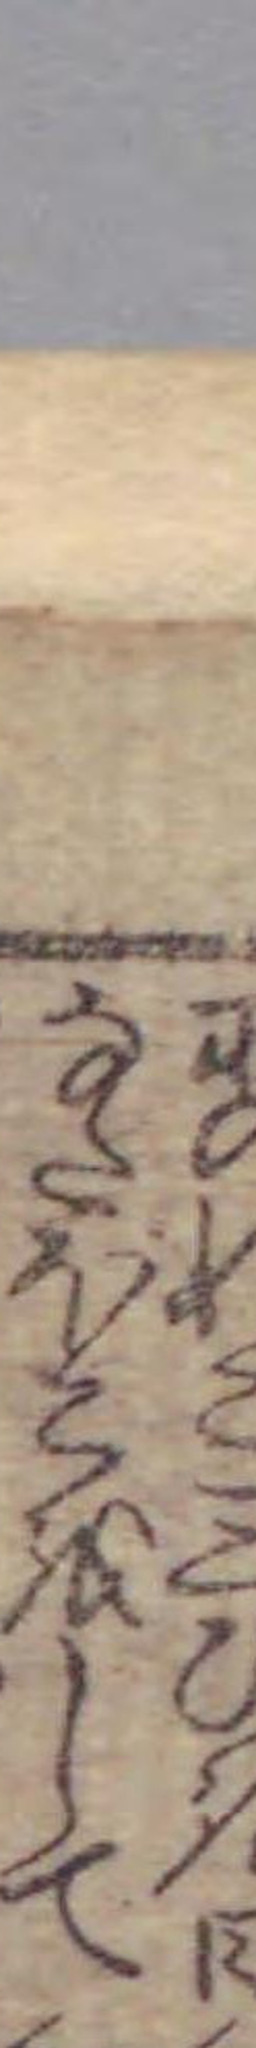なたぼこをして
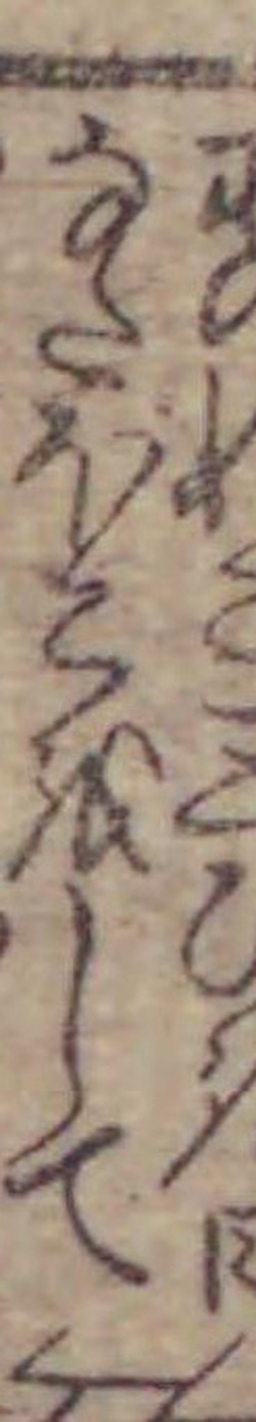なたぼこをして
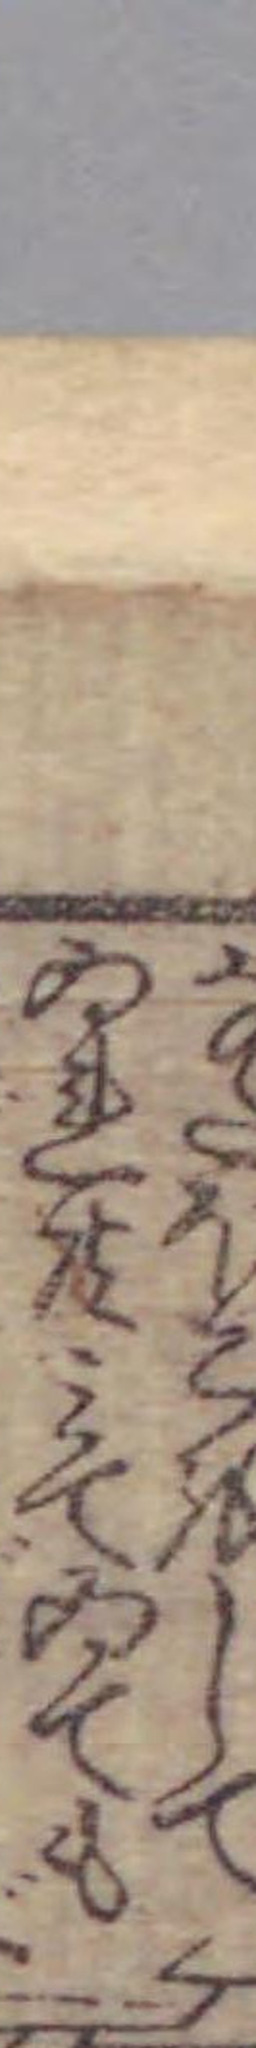ゐれ共みてゐても
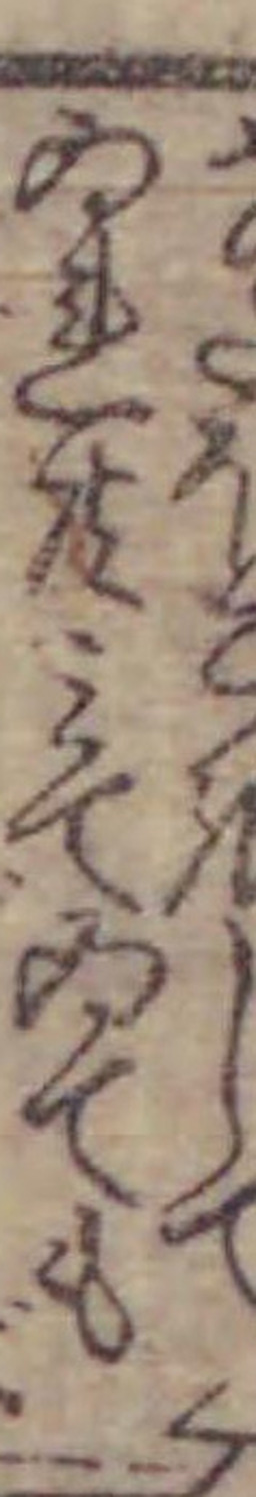ゐれ共みてゐても
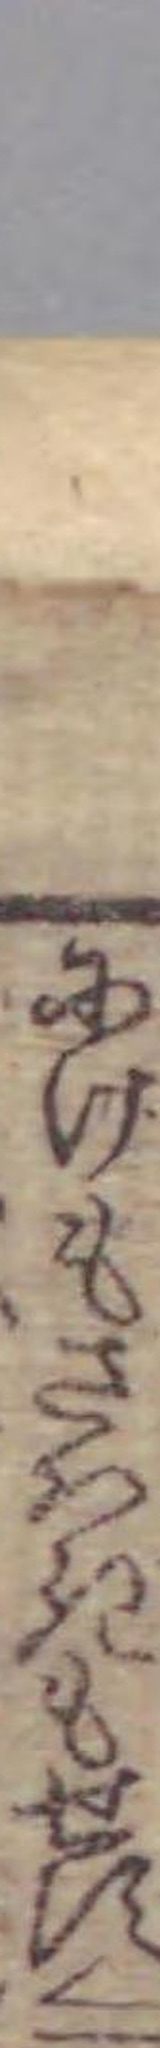にげもさはぎもせず
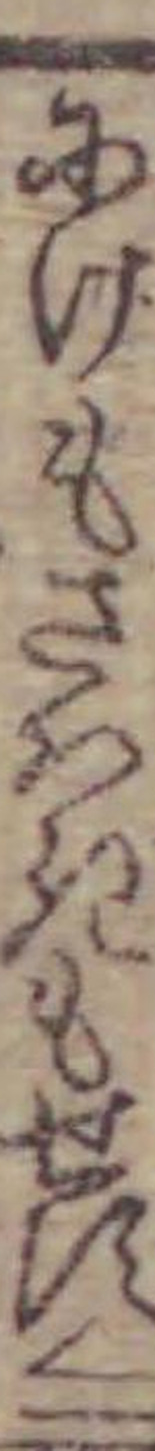にげもさはぎもせず
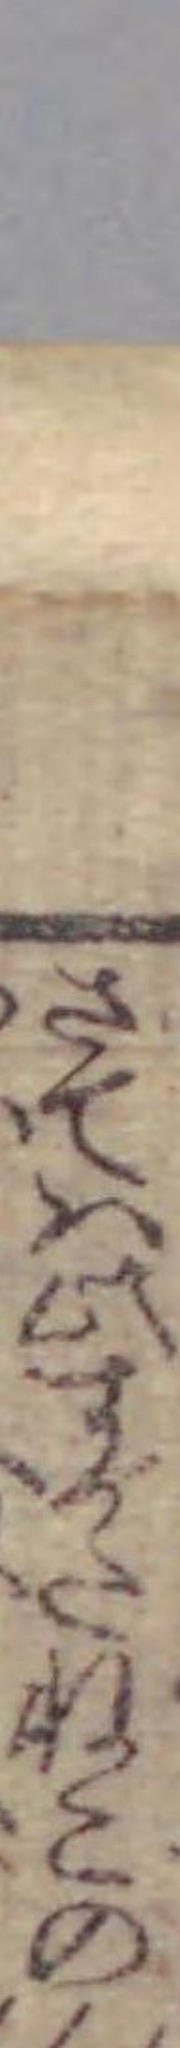さては此すがたねこの
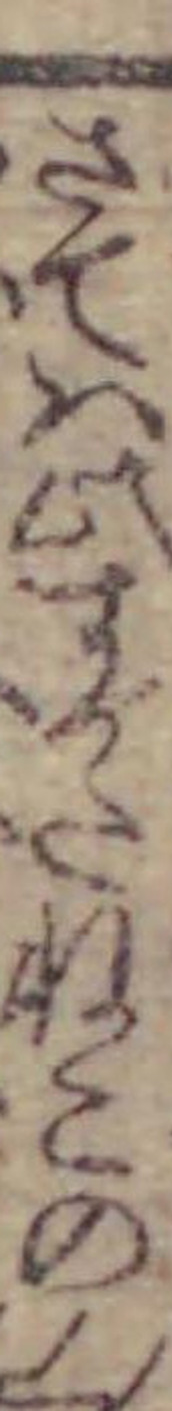さては此すがたねこの
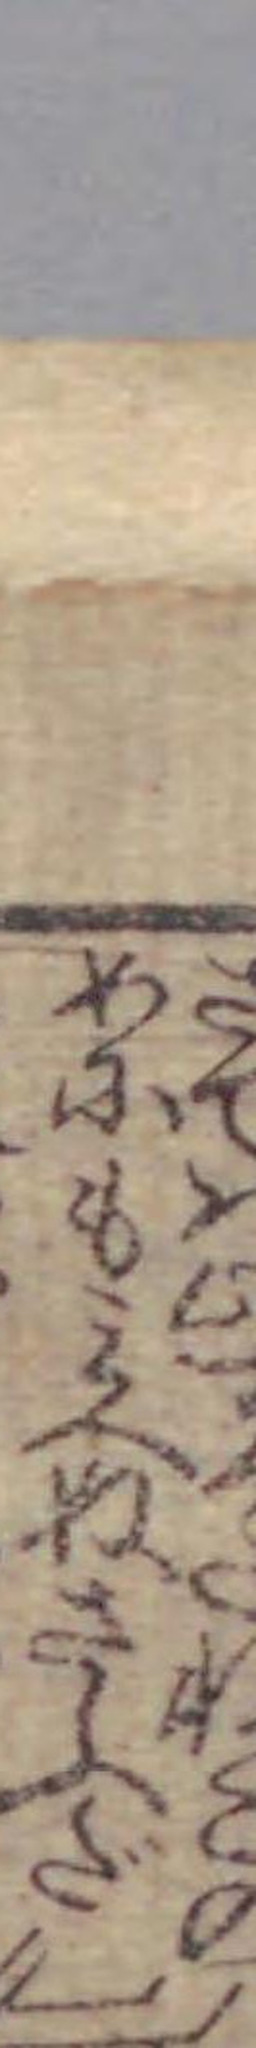めにもみへぬさふだ
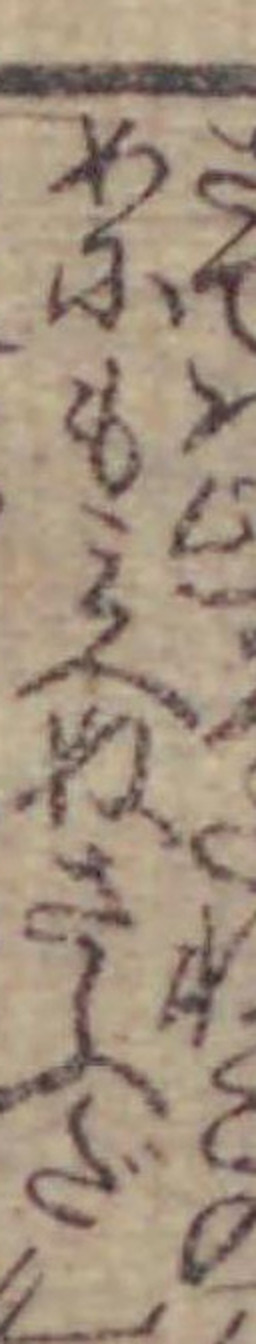めにもみへぬさふだ
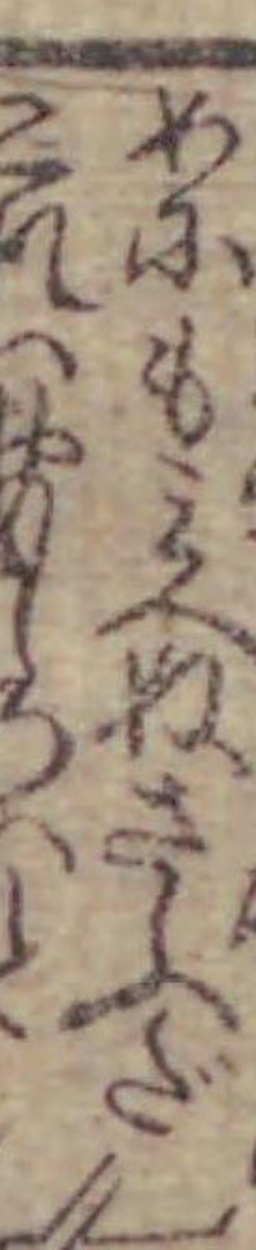これはおもしろいと
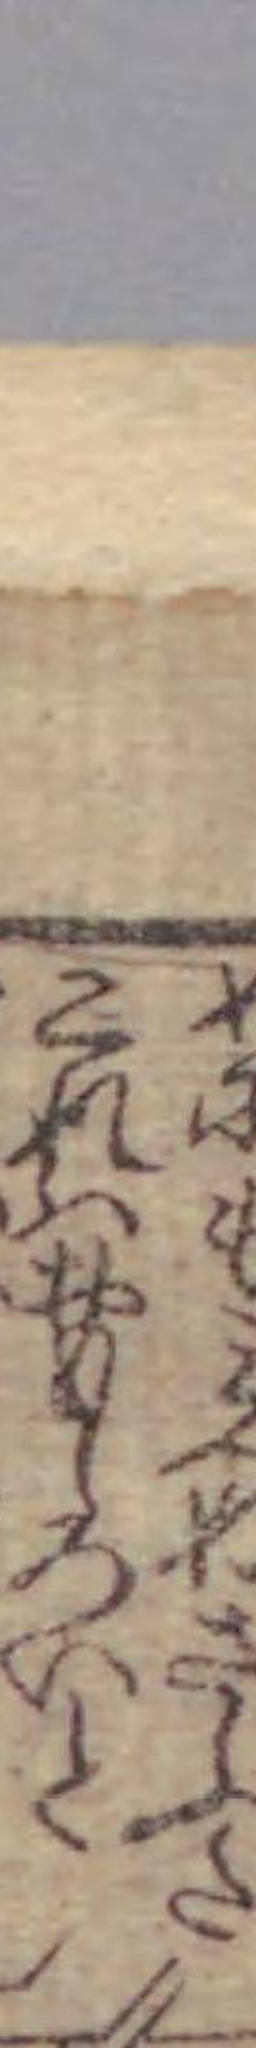これはおもしろいと
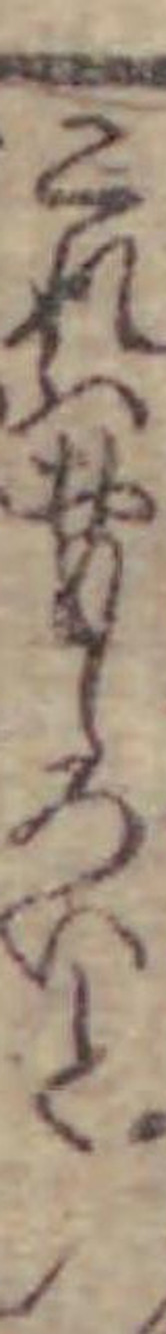これはおもしろいと
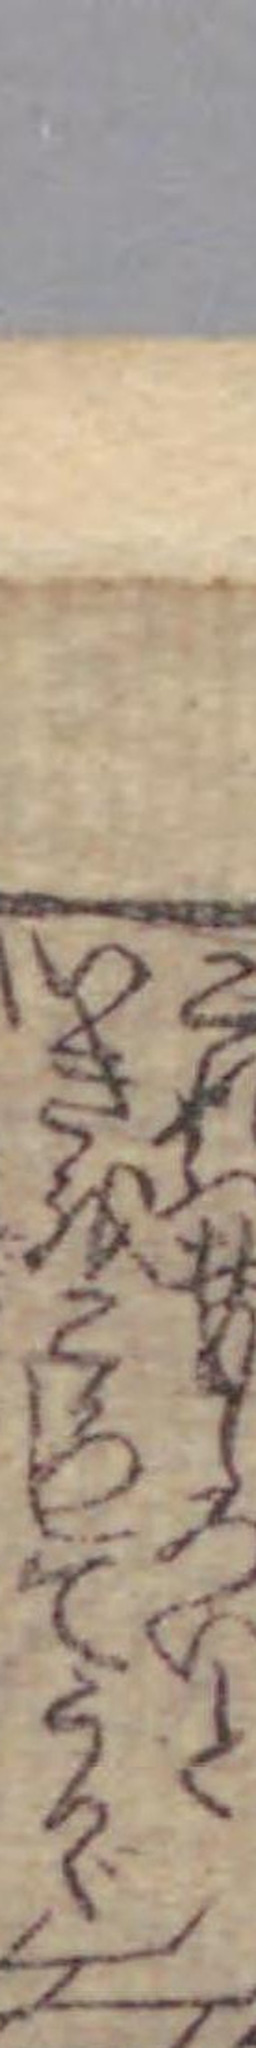いきをころしてうかゞ
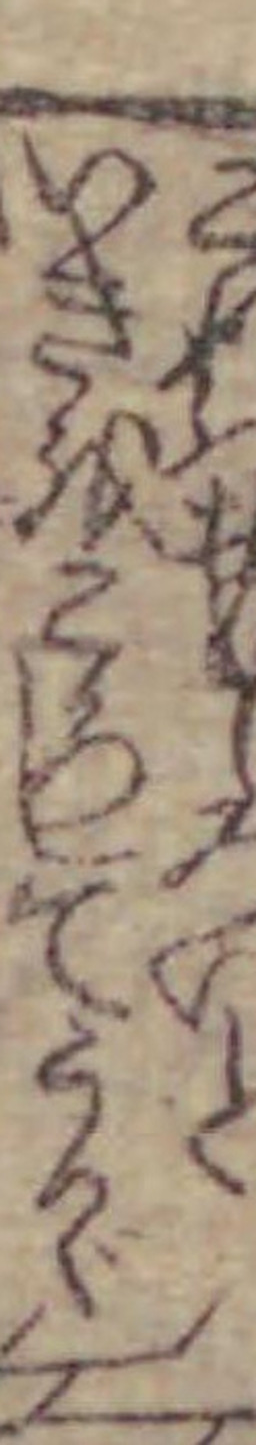いきをころしてうかゞ
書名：即席耳学問 : 3巻
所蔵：国立国会図書館 National Diet Library, JAPAN
